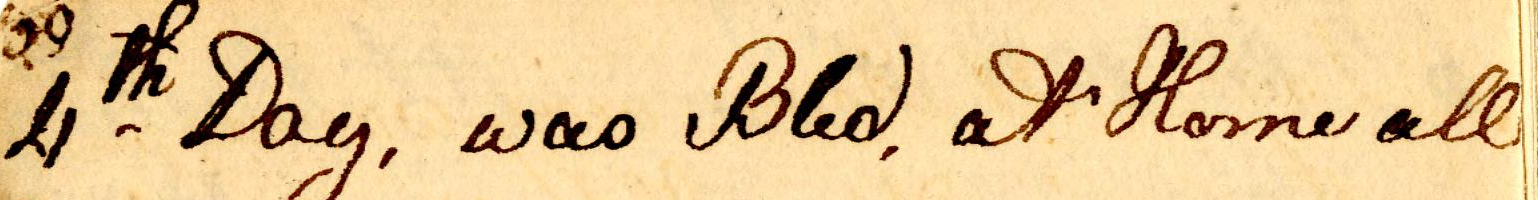4^th Day, was Bled, at Home all
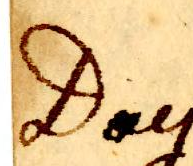Day
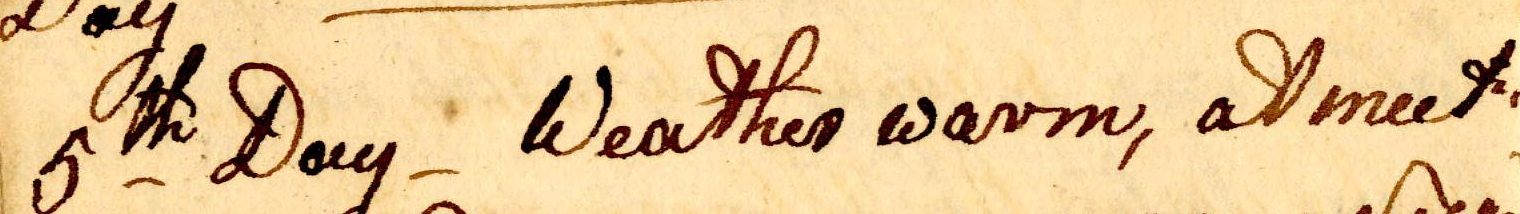5^th Day- Weather warm, at meet
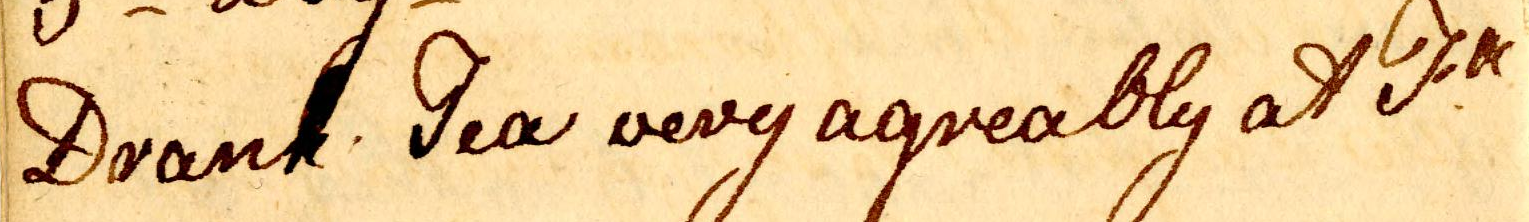Drank Tea very agreably at F^rd
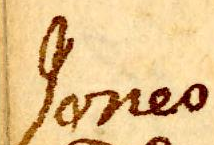Jones
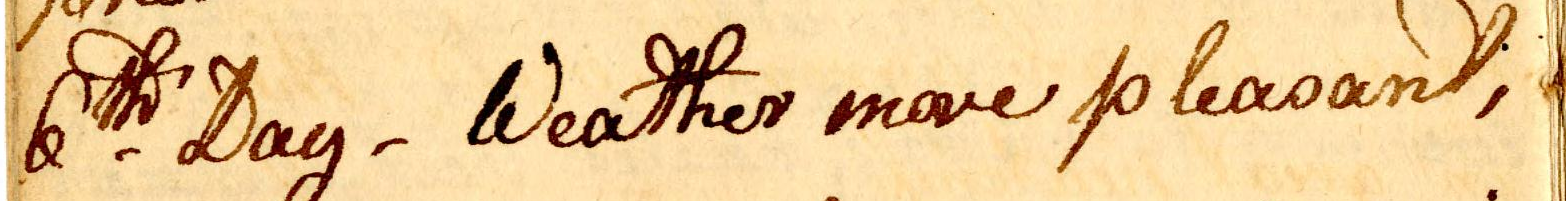6^th Day- Weather more pleasant,
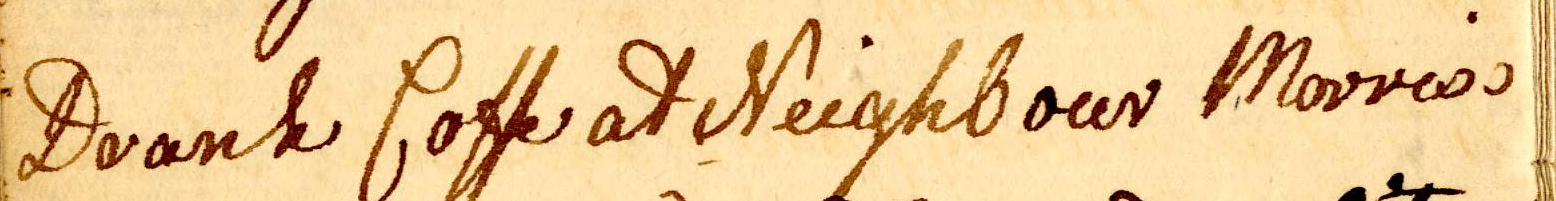Drank Coffe at Neighbour Morriss
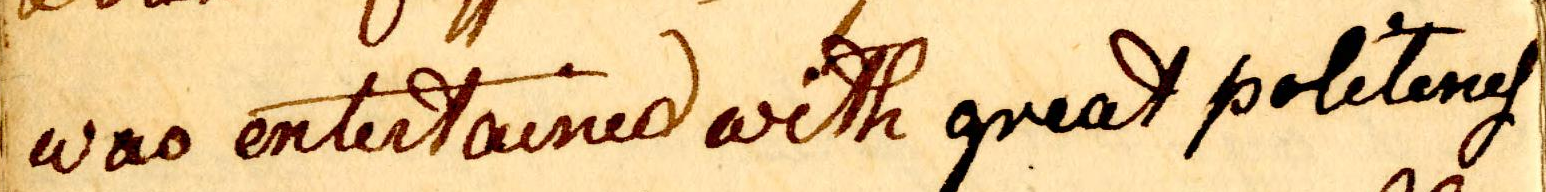was entertained with great politenes
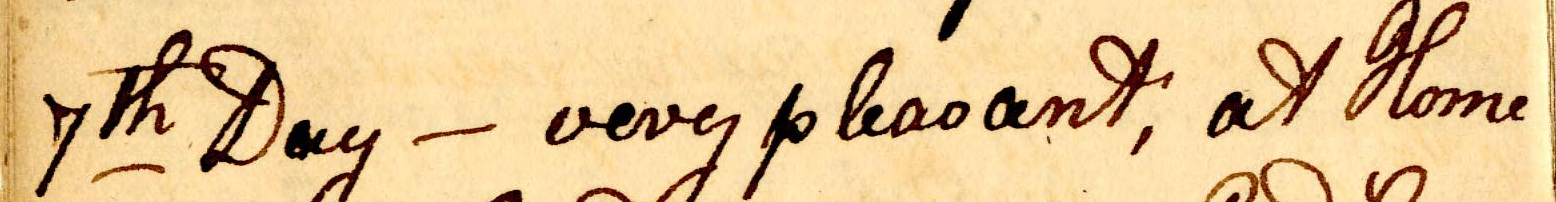7^th Day- very pleasant, at Home
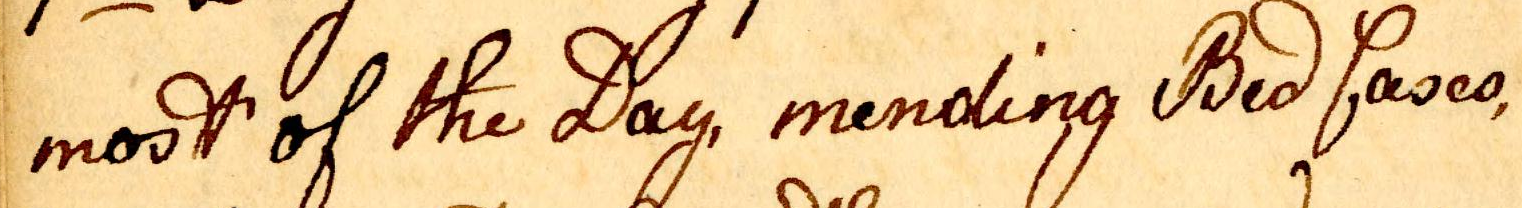most of the Day, mending Bed Cases,
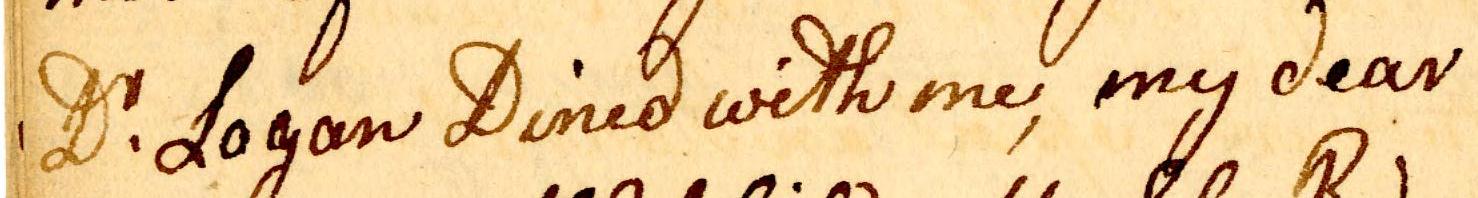D^r. Logan Dined with me, my dear
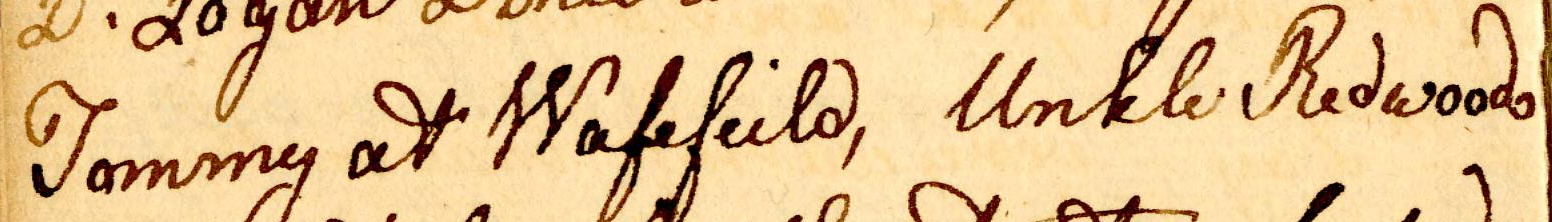Tommy at Wafefeild, Unkle Redwoods
